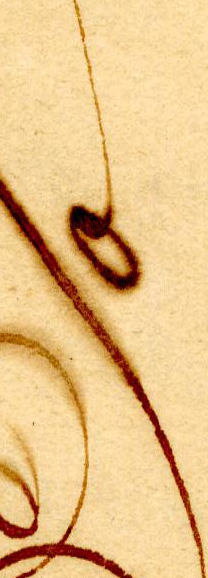To
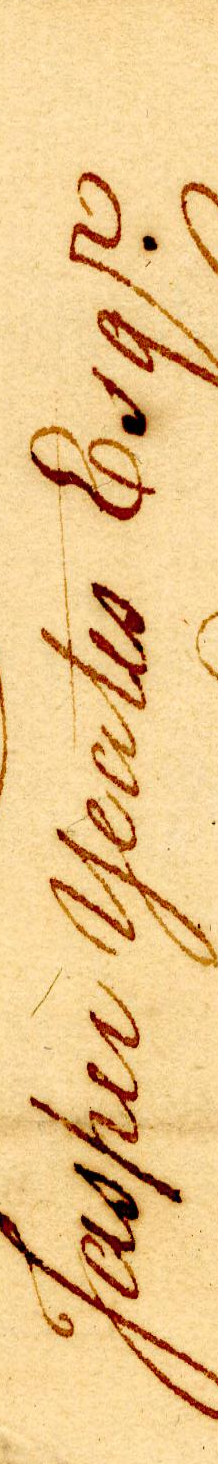Jasper Yeates Esq^r.
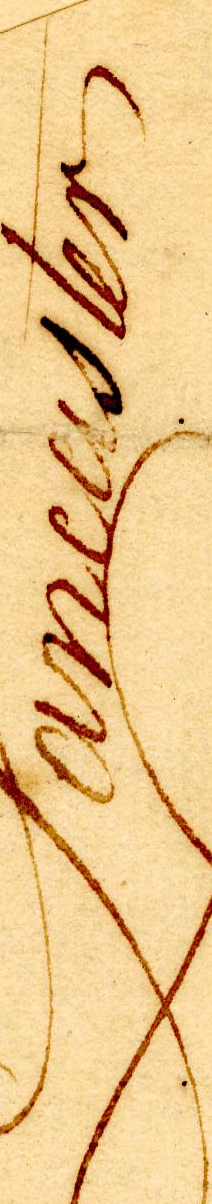Lancaster
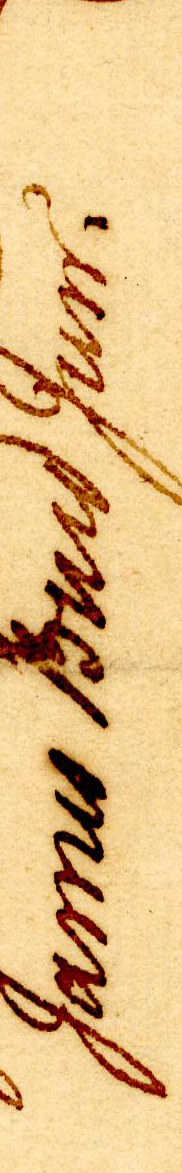James Burd Jun^r.
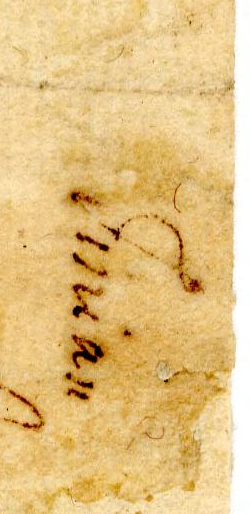Tinian
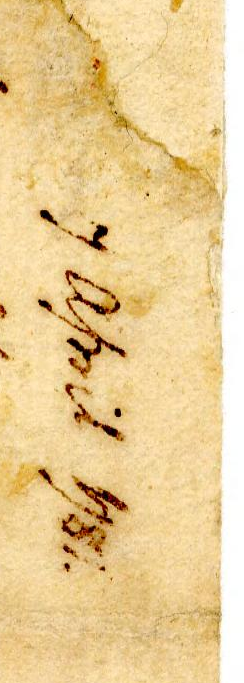7 April 1781
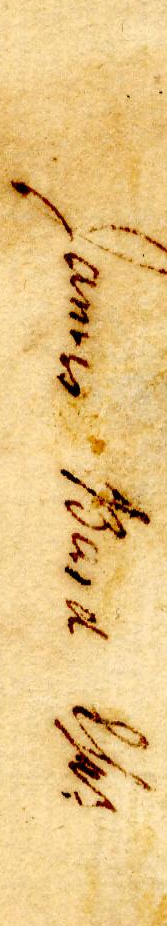James Burd Esq^r.
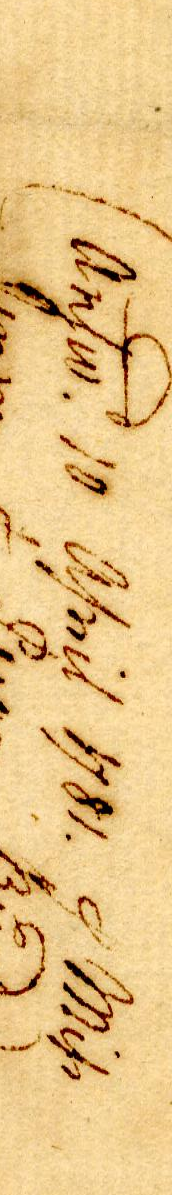(Answ^d. 10 April 1781. per Miss.
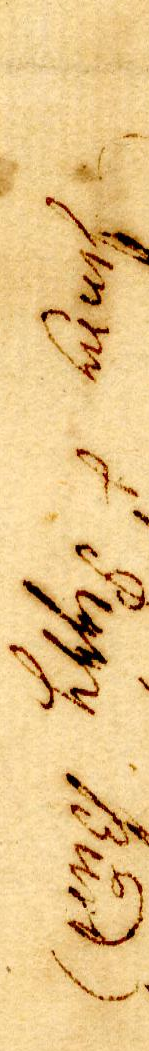Jenny & Peggy Burd
